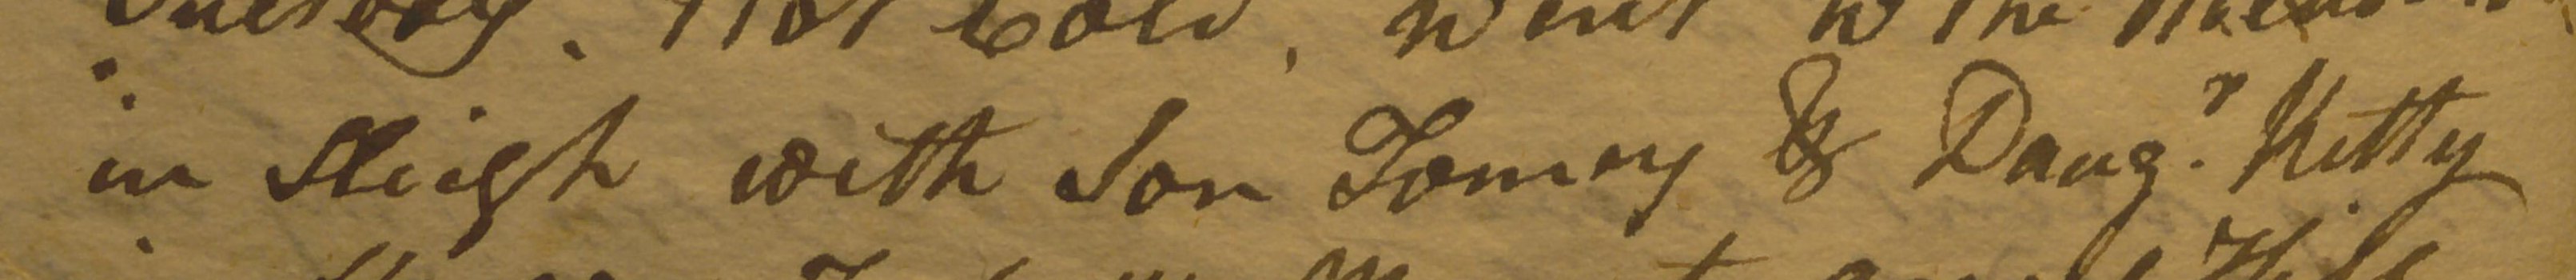in sleigh with Son Tomey & Daug^r. Kitty
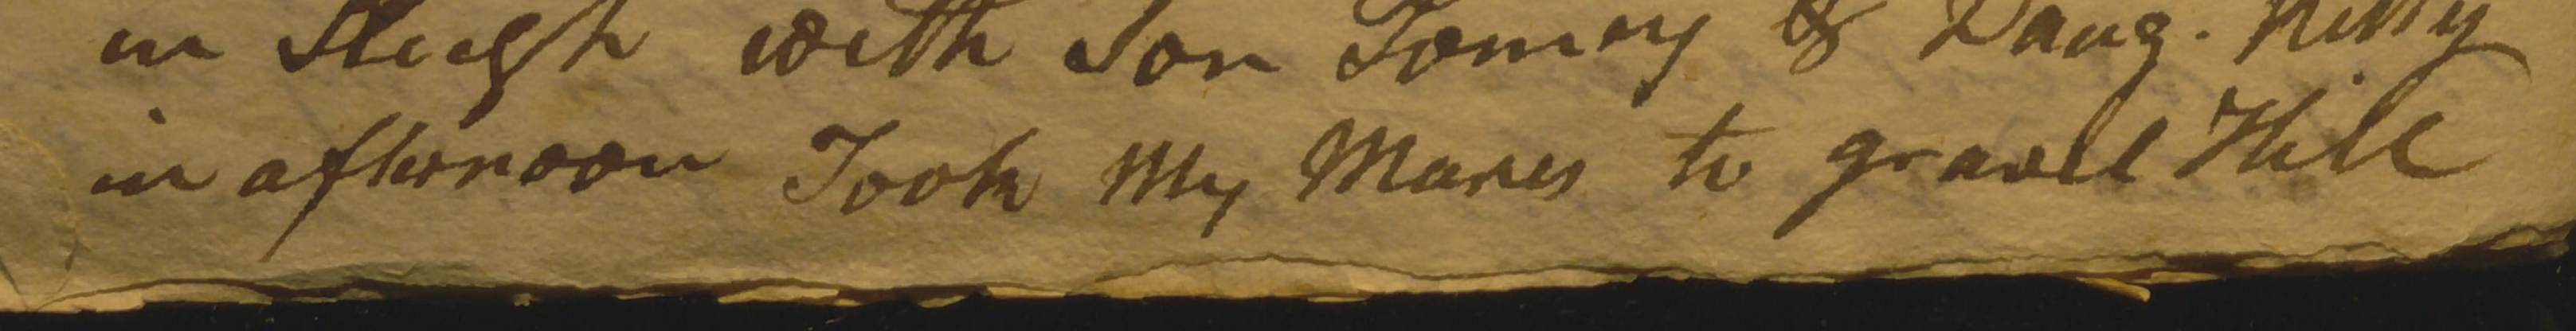in afternoon Took My Mares to gravel Hill
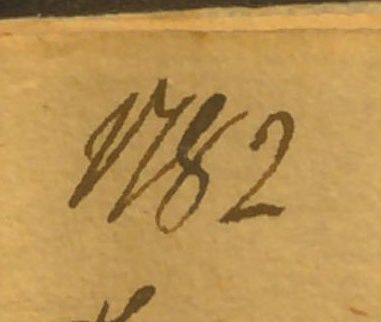1782
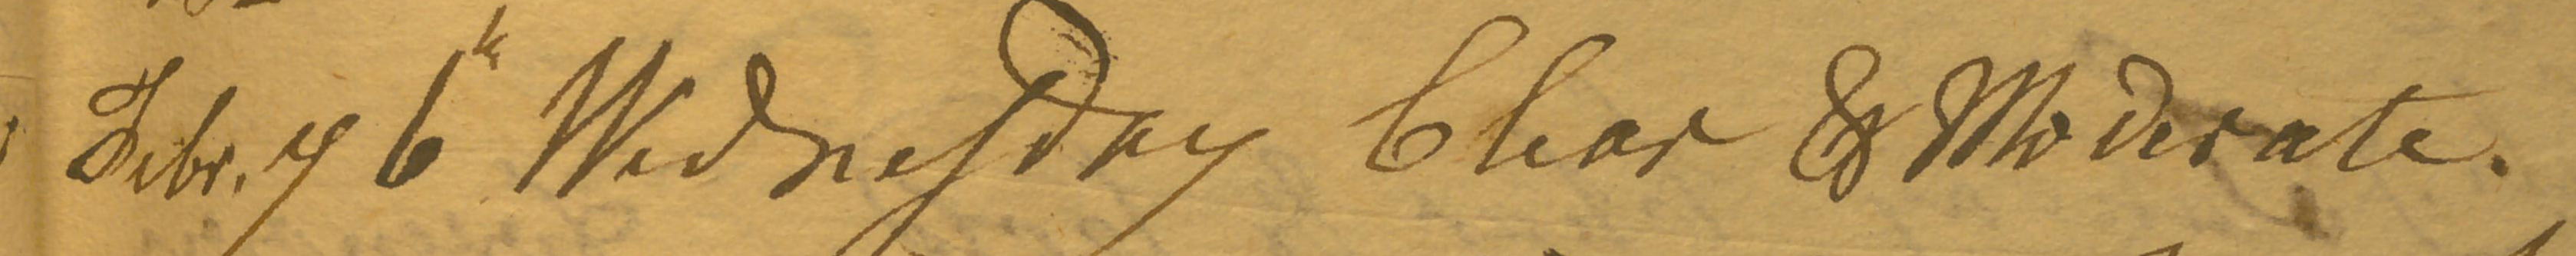Febr^y. 6^h Wednesday Clear & Moderate.
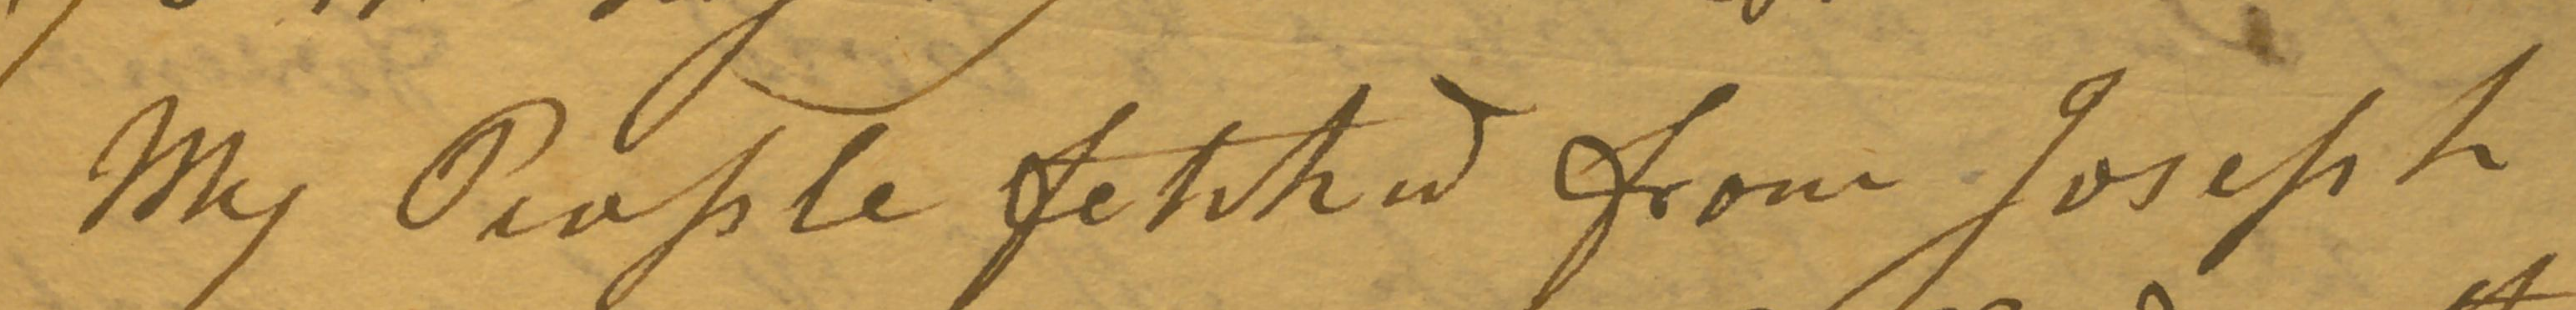My People fetched from Joseph
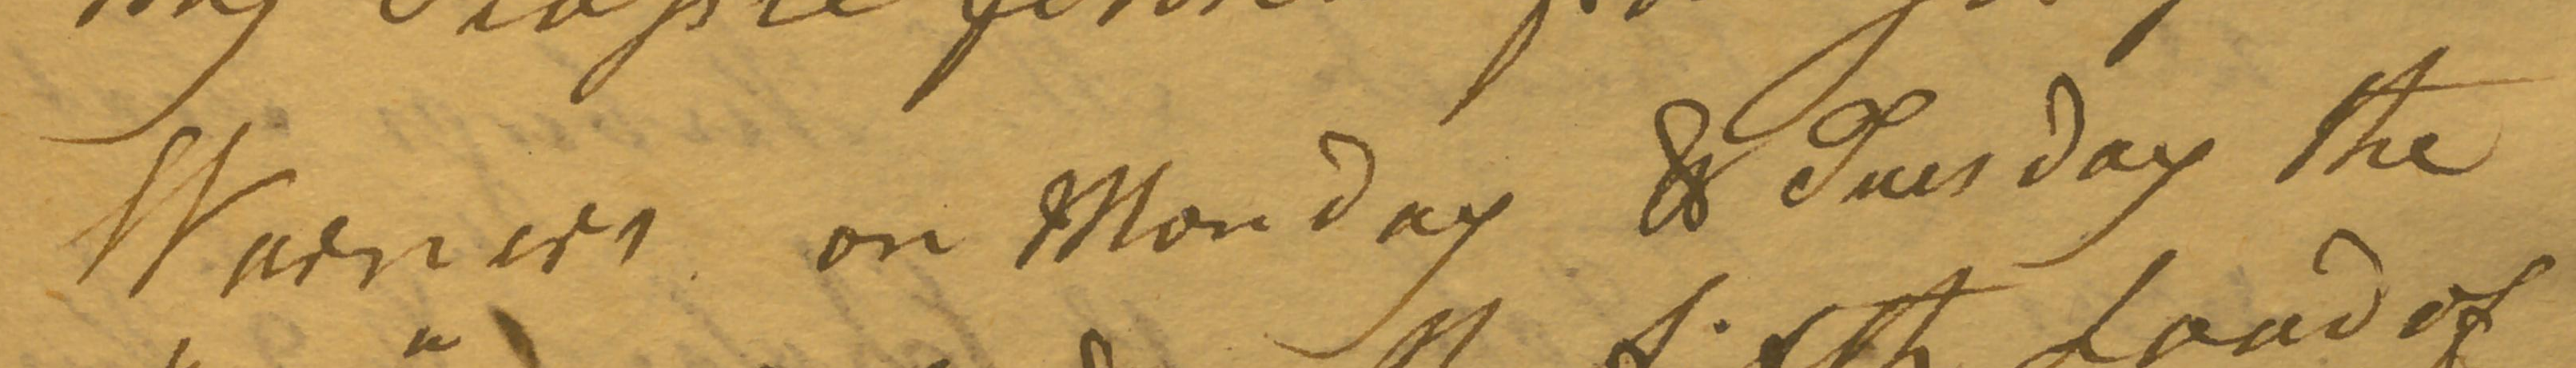Warners on Monday & Tuesday the
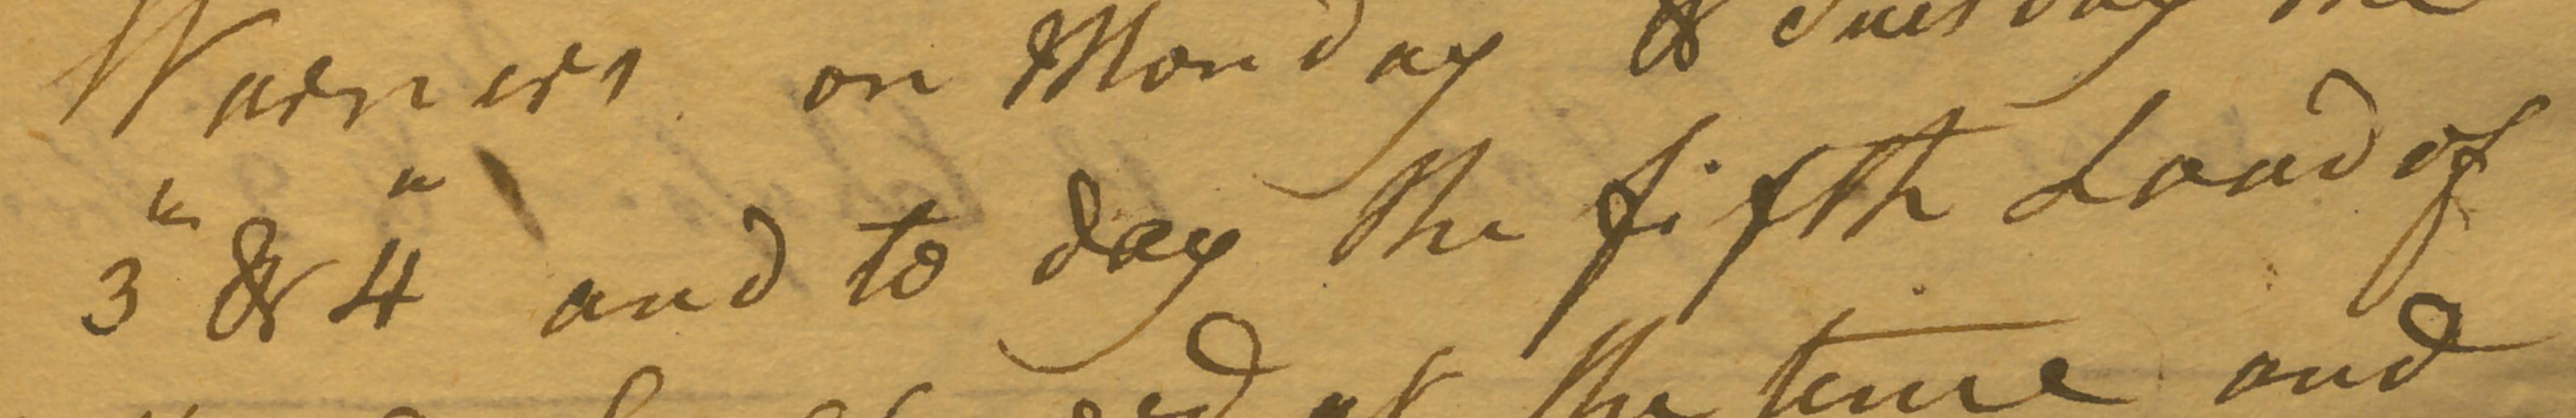3^th & 4^h and to day the fifth Load of
